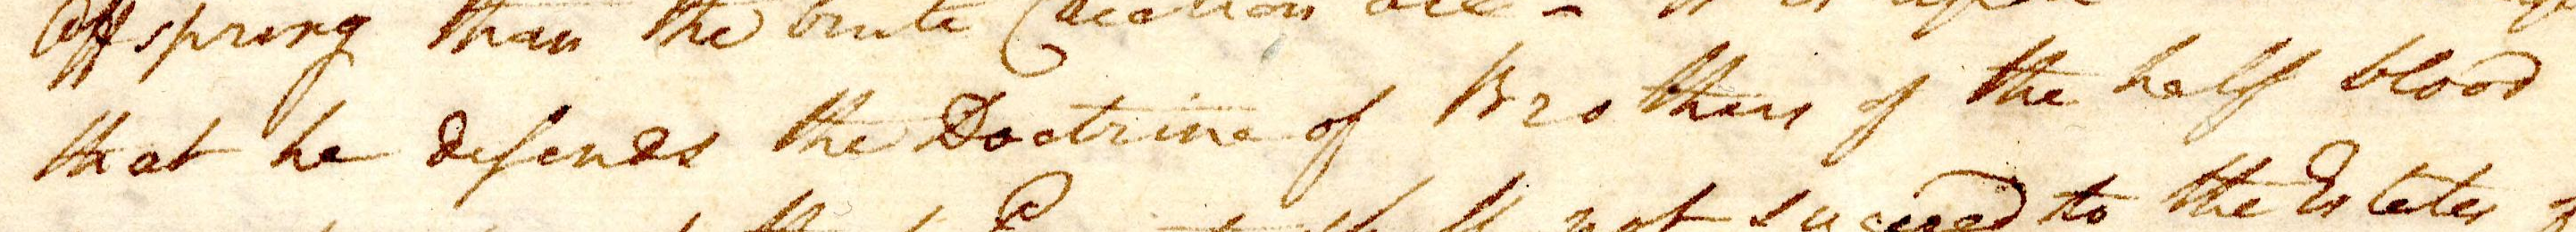that he defends the Doctrine of Brothers of the half blood
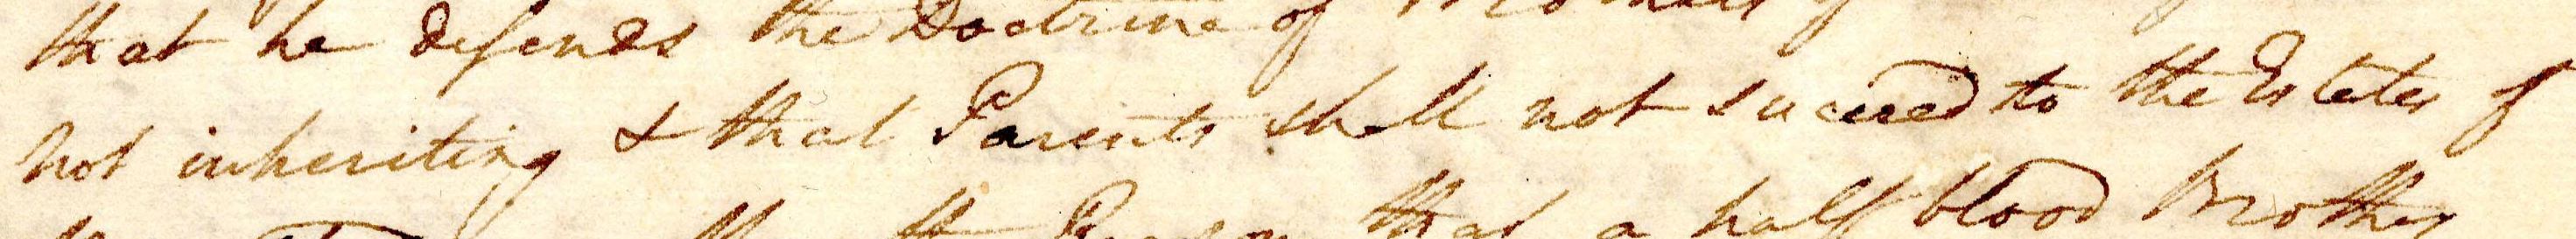not inheriting & that Parents shall not suceed to the Estates of
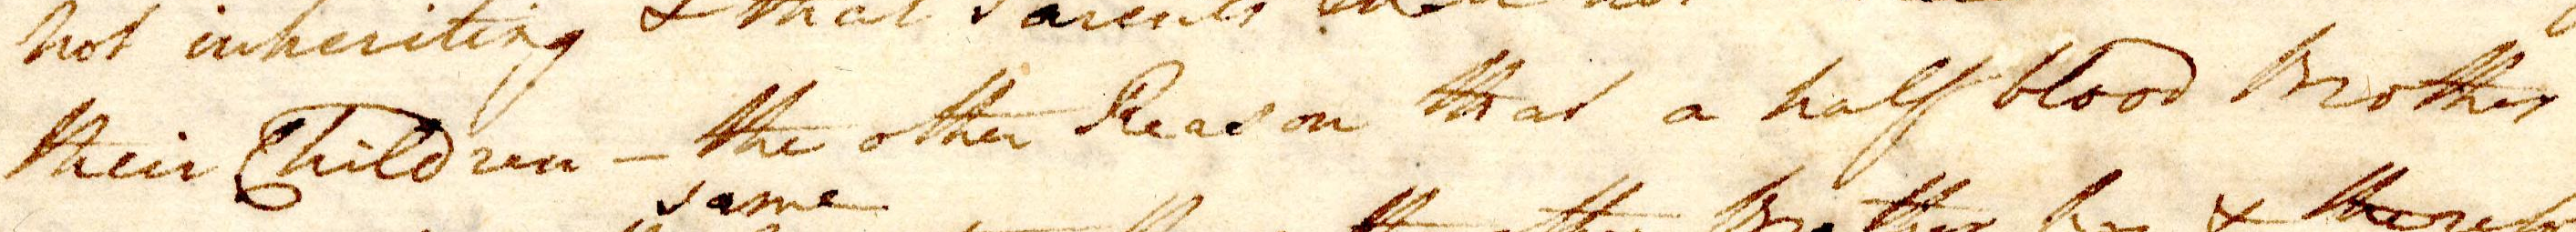their Children- the other Reason that a half blood Brother
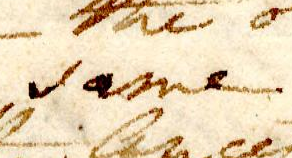same
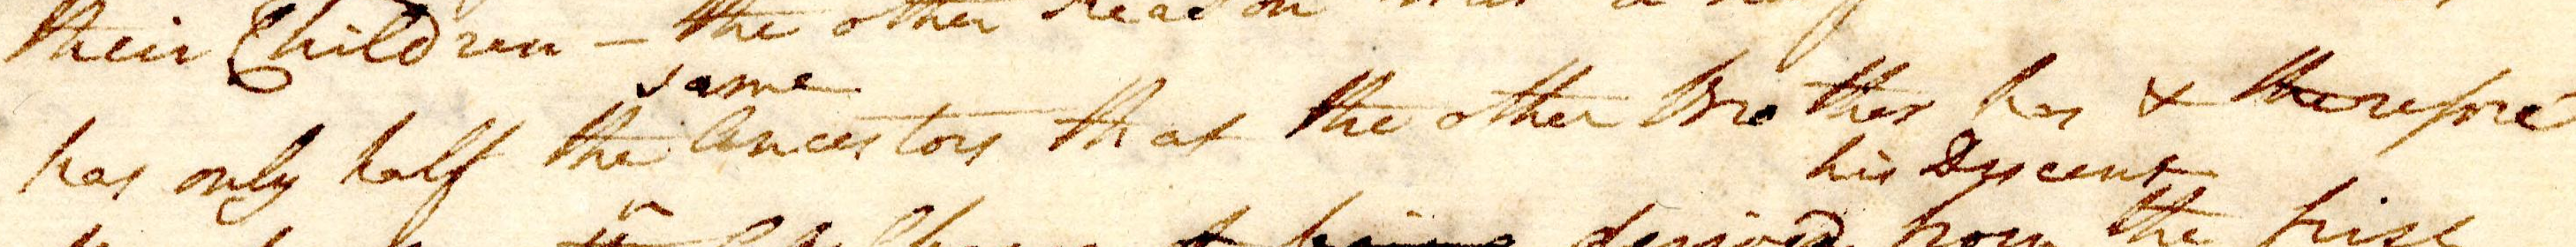has only half the ^ Ancestors that the other Brother has & therefore
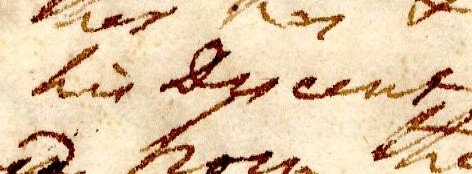his Descent
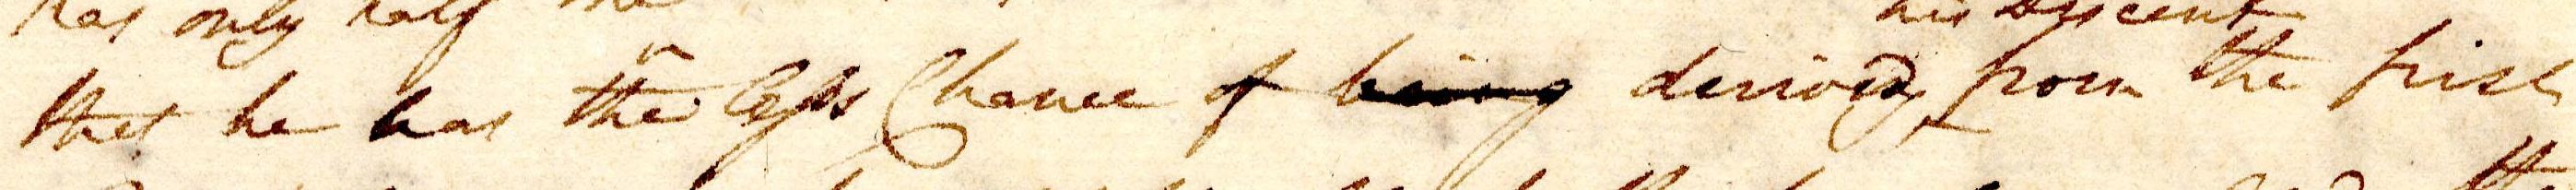that he has the less Chance of being derived ^ from the first
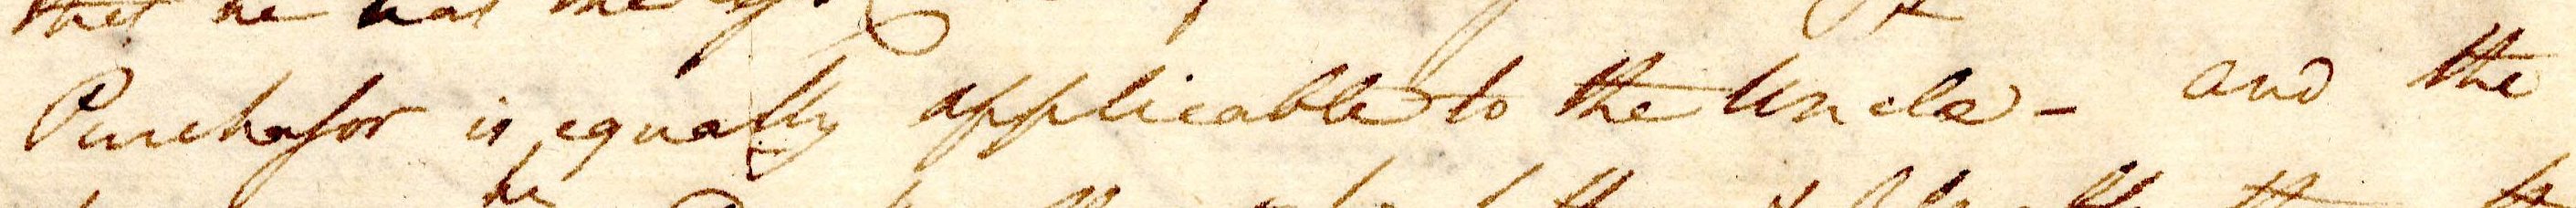Purchasor is equally applicable to the Uncle- and the
